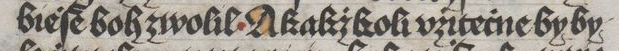bíeẛe bóh zwolil.A kakž koli vziteċne by by¬
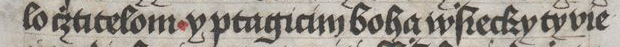lo cżtitelom.y ptagicim boha wẛiecky ty víe¬
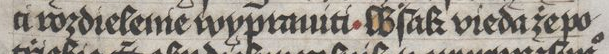ci rozdielenie wyprauiti.Wẛak vieda že po¬
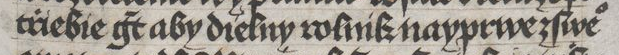tṙiebie ḡt aby dielny rolník nayprwé zſweo
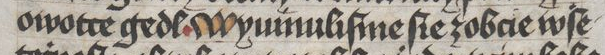owotce gedl.Wyumuliſme ſie zobcie wẛe¬
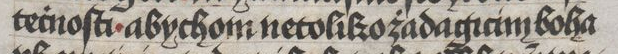teċnoſti.abychom netoliko zadagicím boha
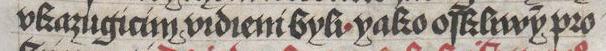vkazugicím vidieni bylu.yako oſkliwȳ pro¬
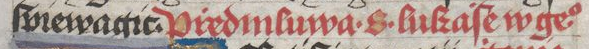ſpiewagíc.Pṙedmluwa.S.lukaẛe w geo
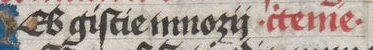Eb giſtie mnozý.ċteníe.
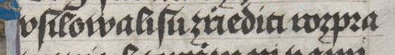vſllowaliſu zṙiediti rozpra¬
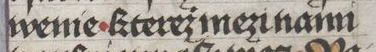wenie.ktereż mezi nami
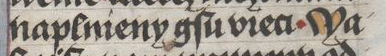naplnieny gſu vieci.Ya-
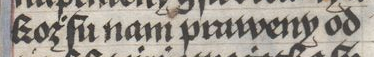koż ſu nam praweny od
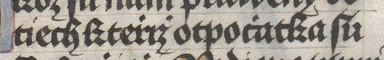tiech kteṙiż otpoċatka ſu
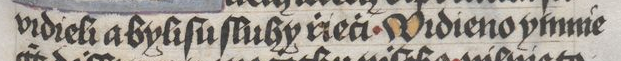vidieli a byliſu ſluhy ṙíeċi.Vidieno ymmnie
